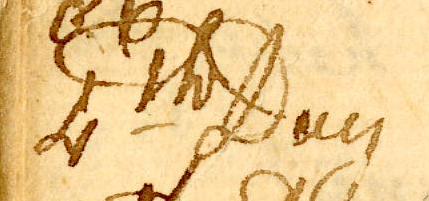4^th Day
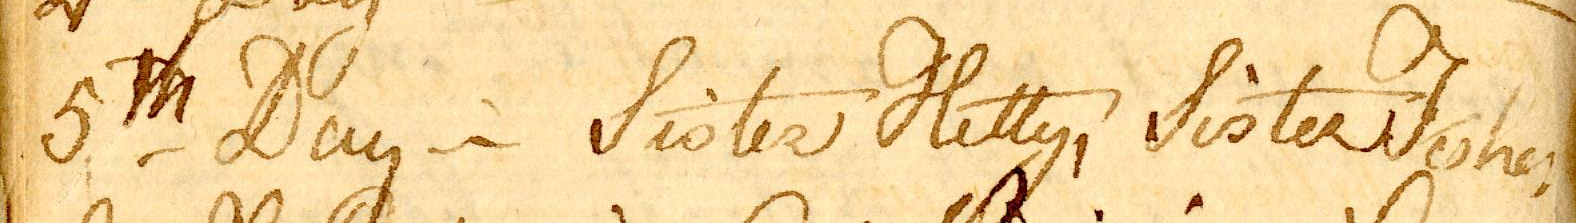5^th Day- Sister Hetty, Sister Fisher
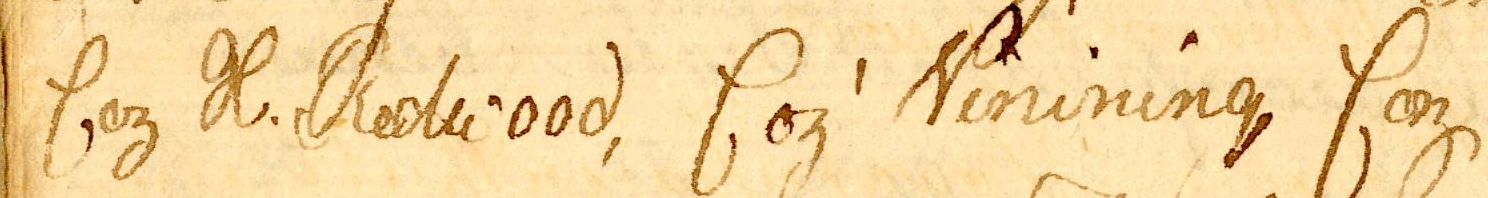Coz H. Redwood, Coz' Vinining Coz
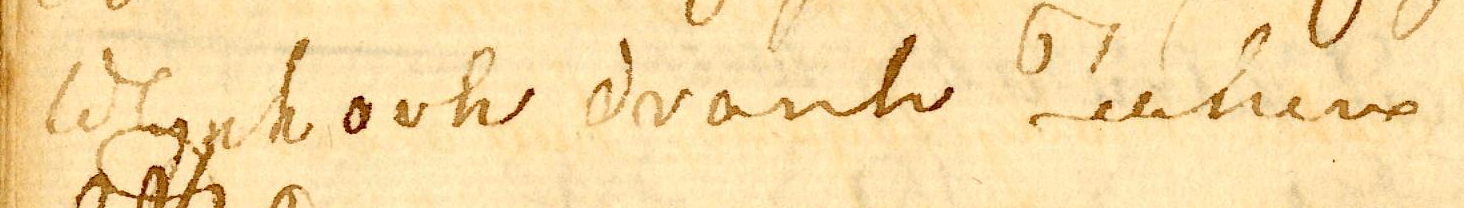Wynkosh drank Tea here
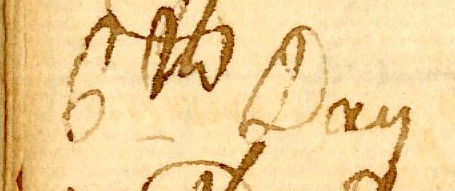6^th Day
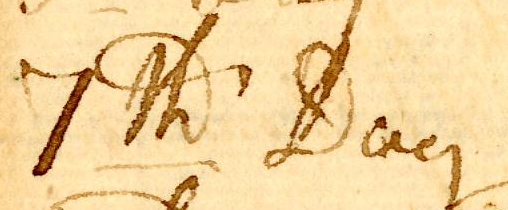7^th Day
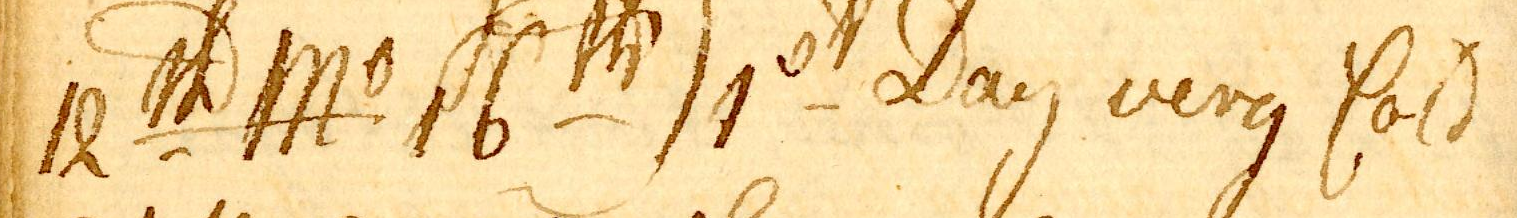12^th M^o 16^th) 1^st Day very Cold
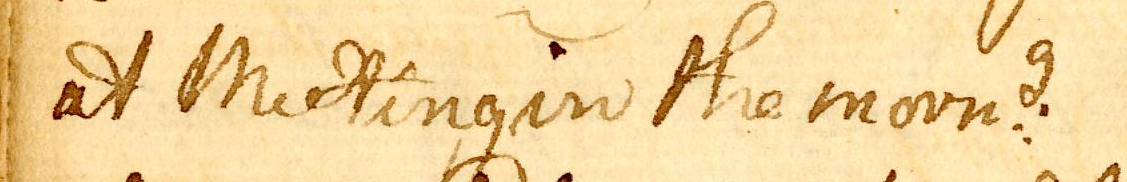at Meeting in the morn^g
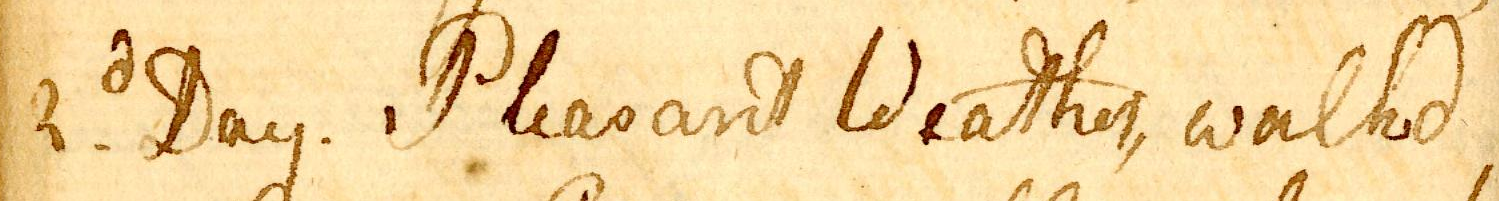2^d Day. Pleasant Weather, walkd
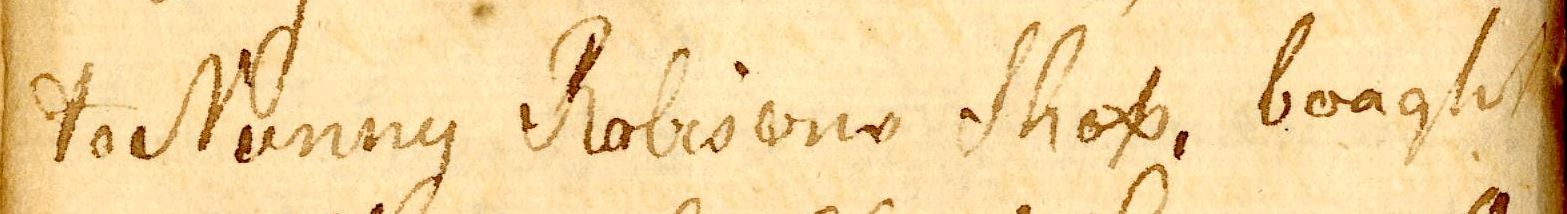to Nanny Robisons Shop, boaght
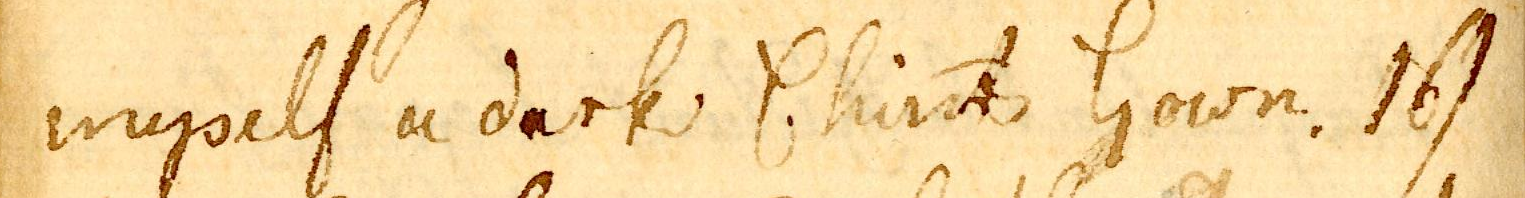myself a dark Chints Gown, 16s
